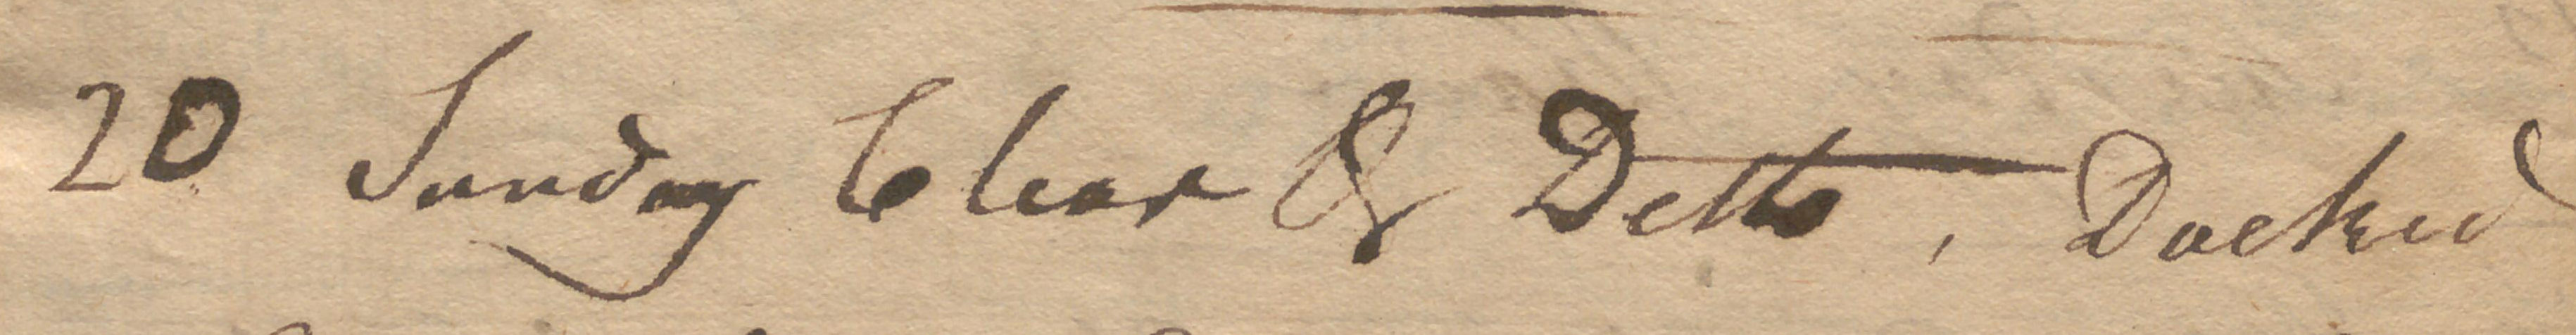Sunday Clear & Ditto, Dacked
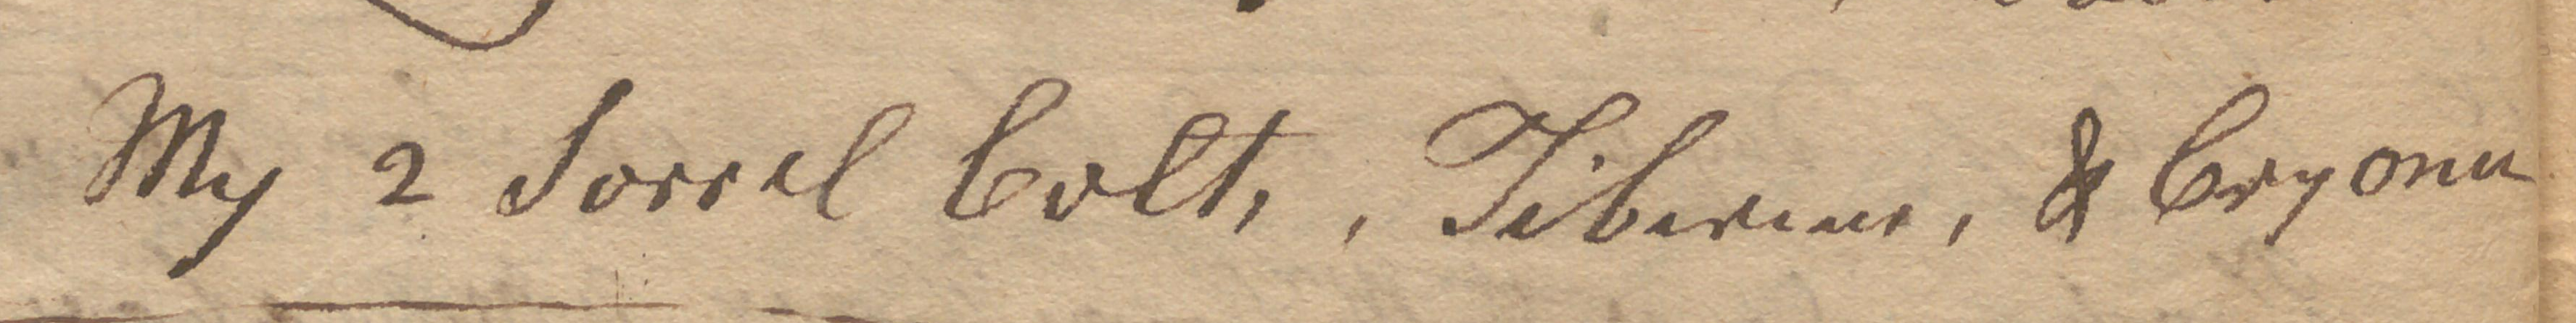My 2 Sorrel Colts, Tiberias, & Cryonn
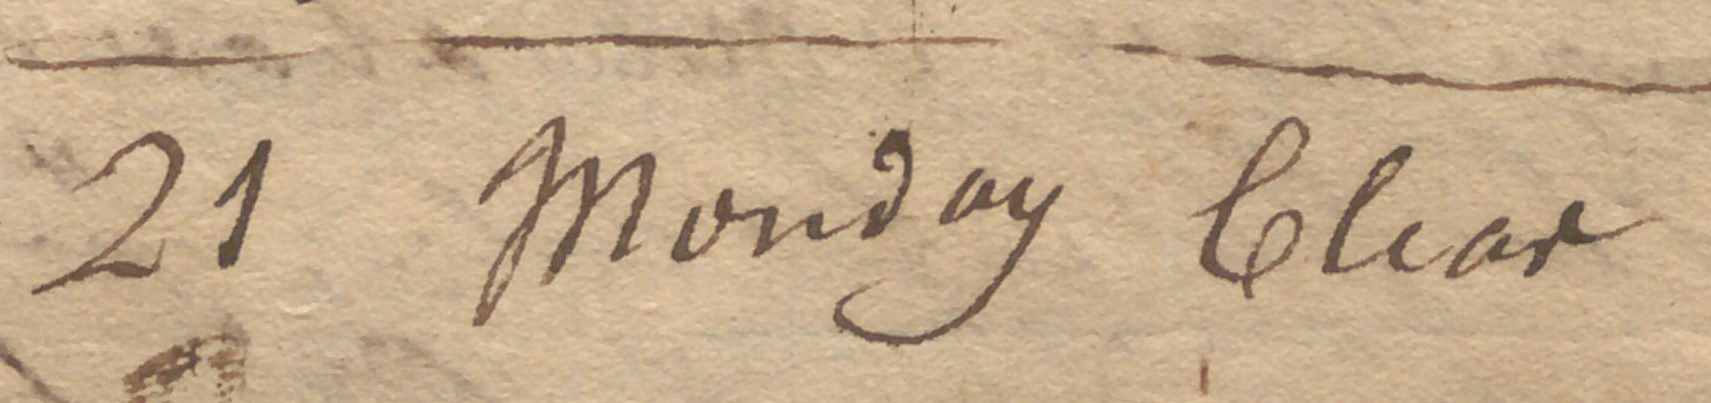21 Monday Clear
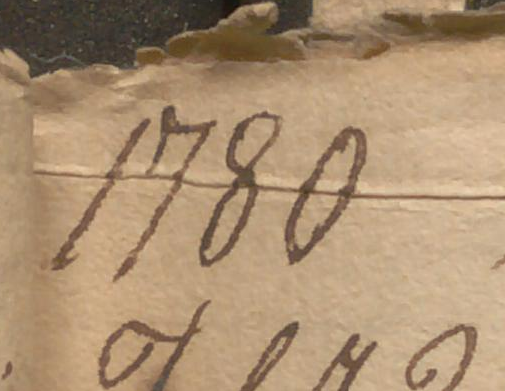1780
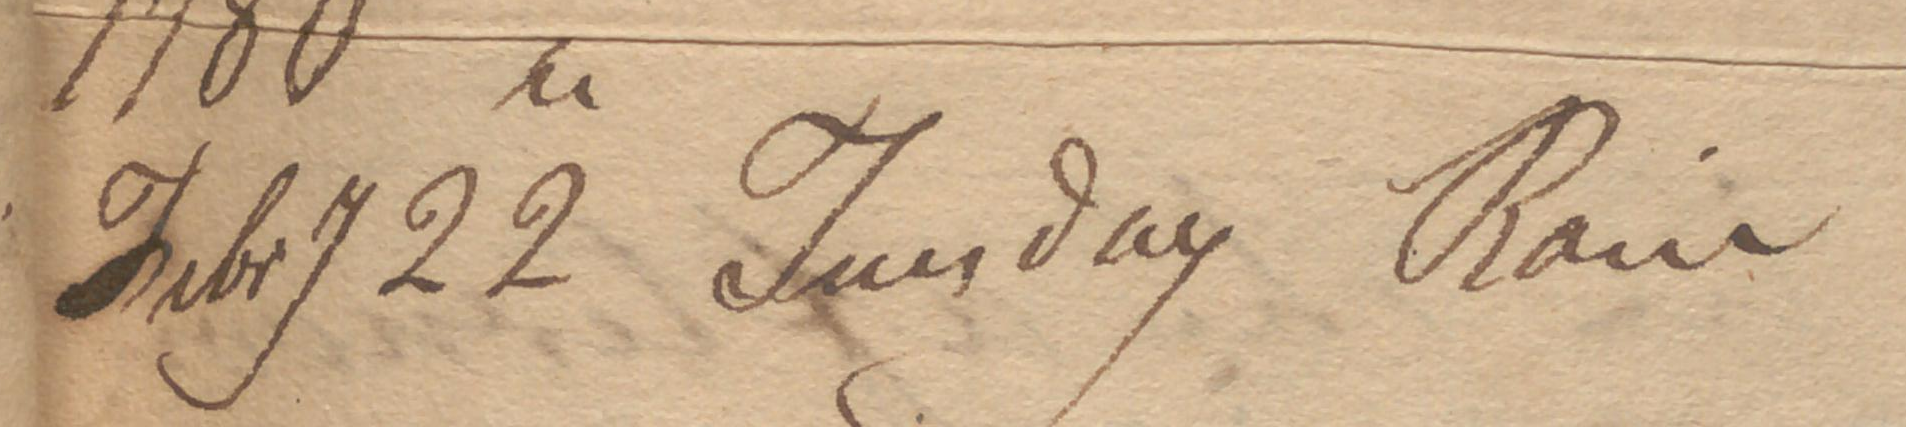Febr^y 22^th Tuesday Rain
